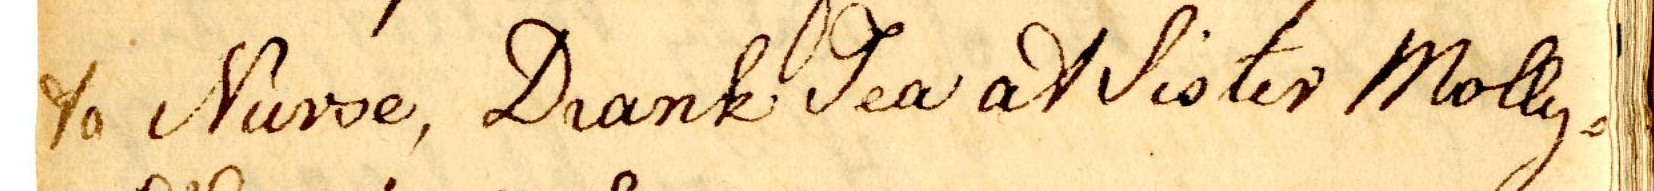to Nurse, Drank Tea at Sister Mollys
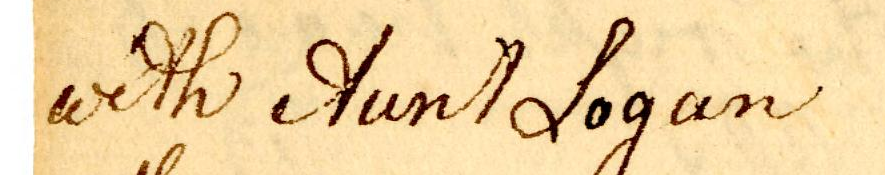with Aunt Logan
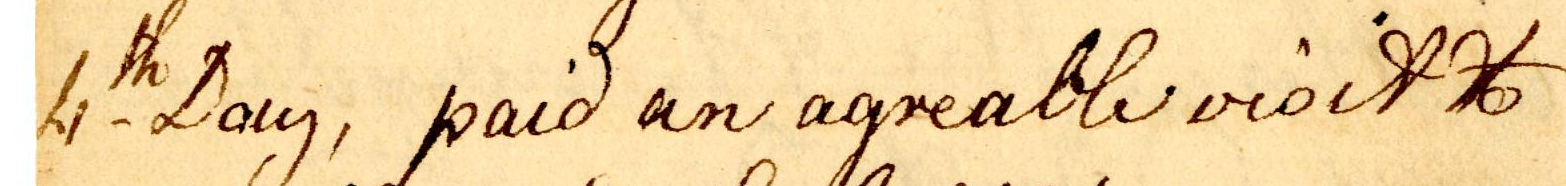4^th Day, paid an agreable visit to
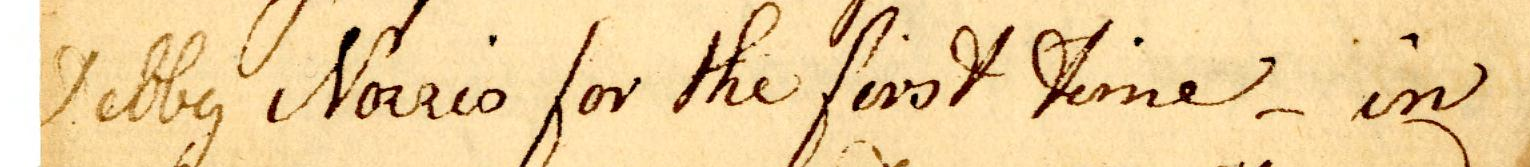Debby Norris for the first time- in
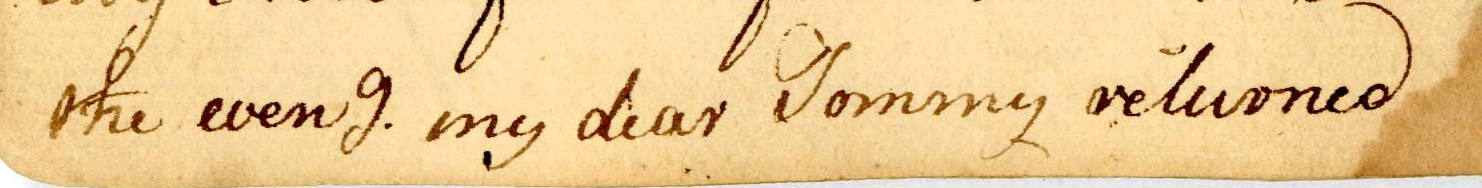the even^g. my dear Tommy returned
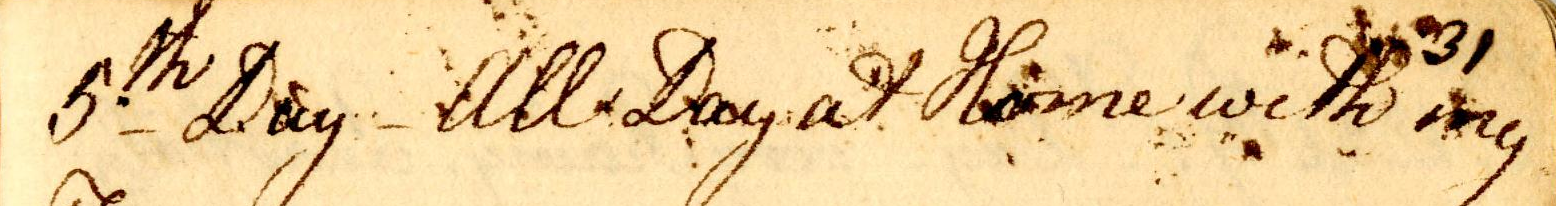5^th Day- All day at Home with my
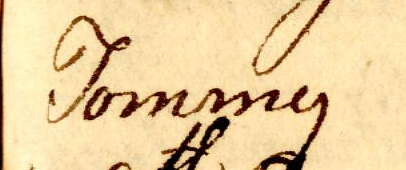Tommy
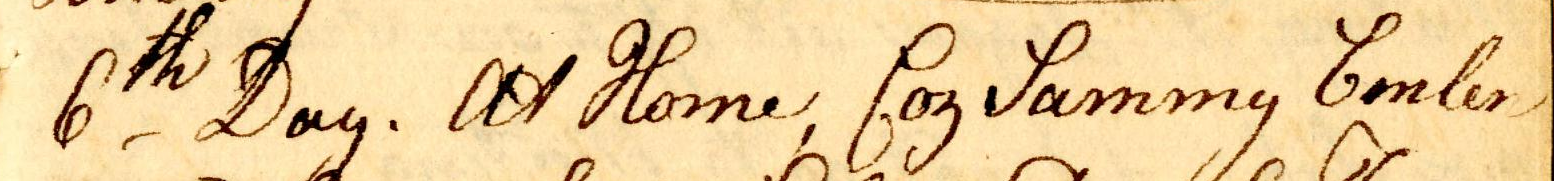6^th Day. At Home, Coz Sammy Emlen
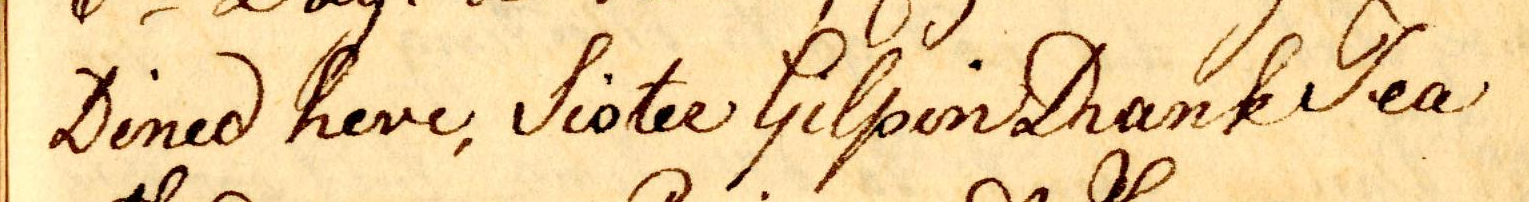Dined here, Sister Gilpin Drank Tea
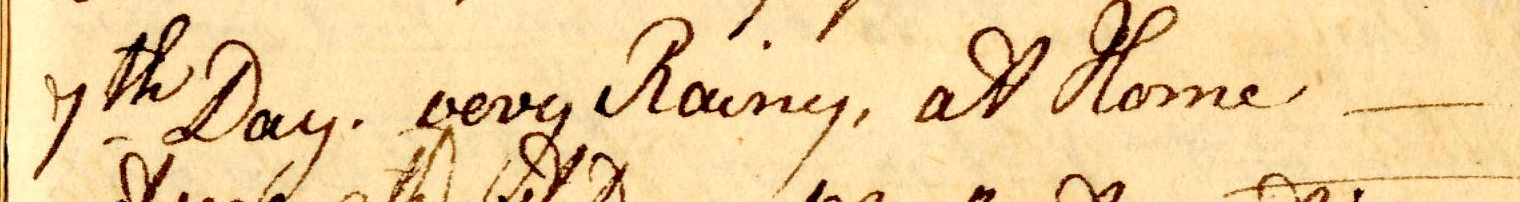7^th Day. very Rainy, at Home
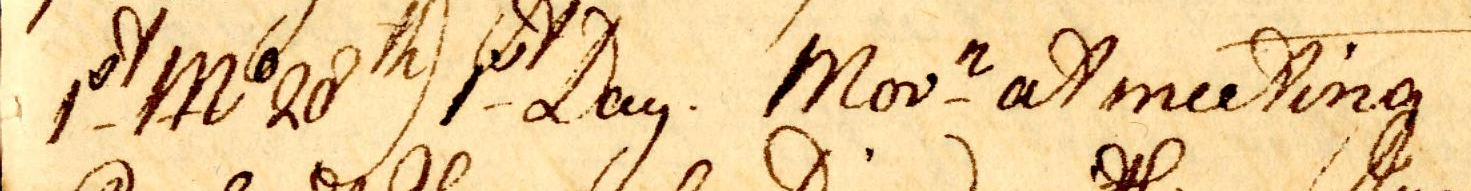1^st M^o 20^th) 1^st Day. Mor^n at meeting
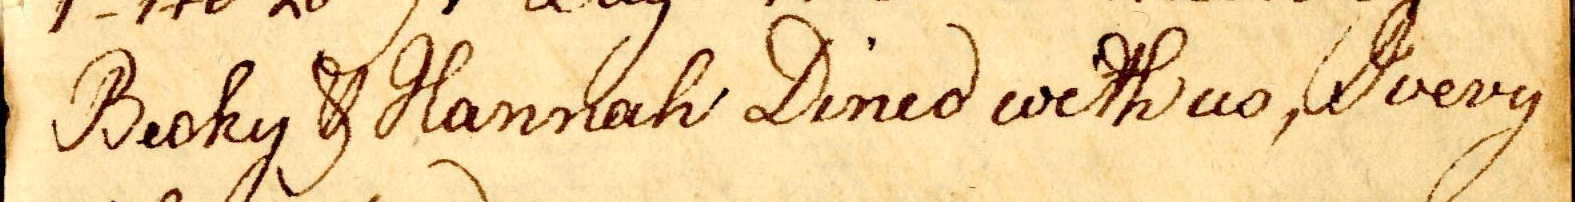Becky & Hannah Dined with us, I very
